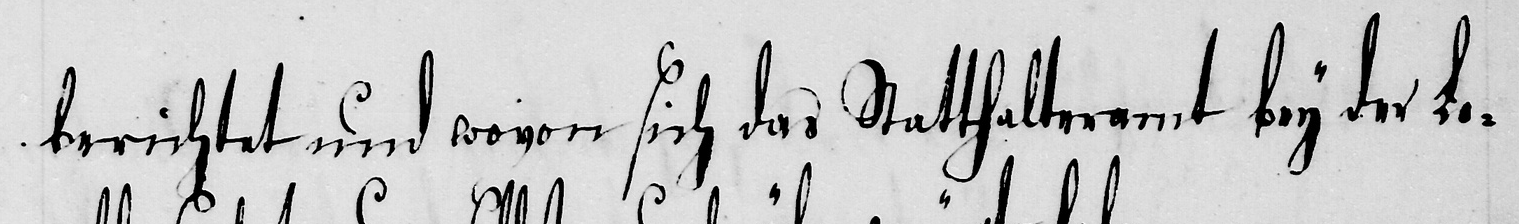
berichtet und wovon sich das Statthalteramt bey der Lo¬
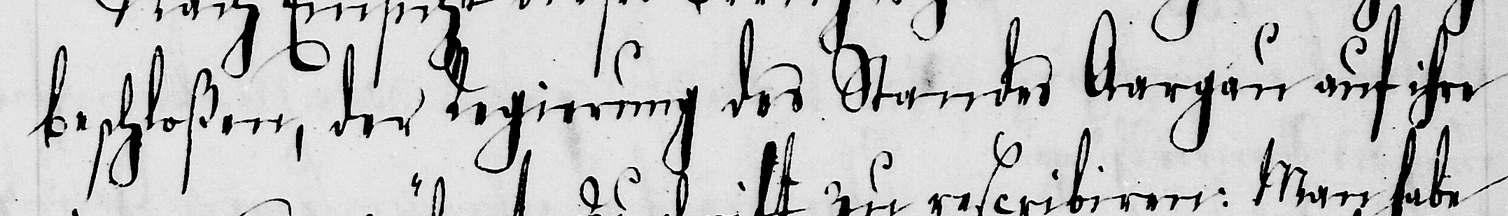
beschloßen, der Regierung des Standes Aargau auf ihre
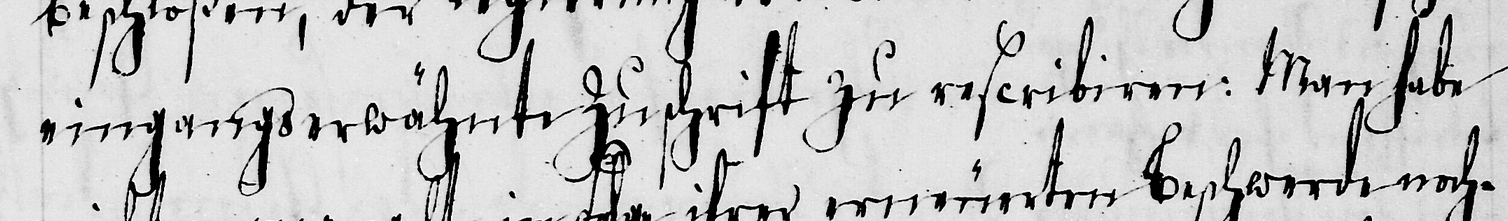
eingangserwähnte Zuschrift zu rescribiren: Man habe
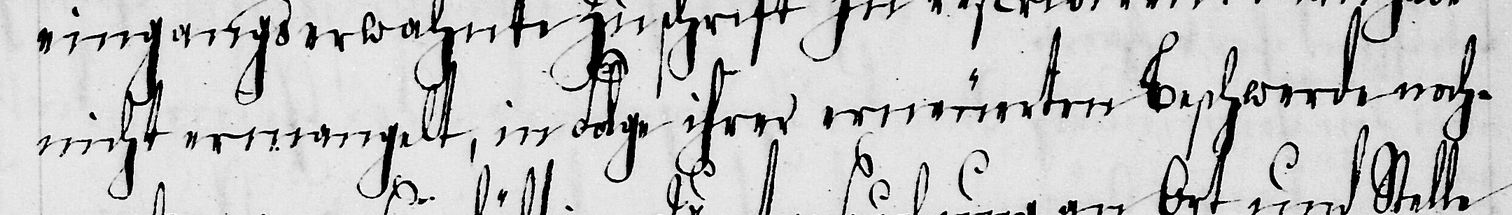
nicht ermangelt, in Folge ihrer erneuerten Beschwerde noch¬
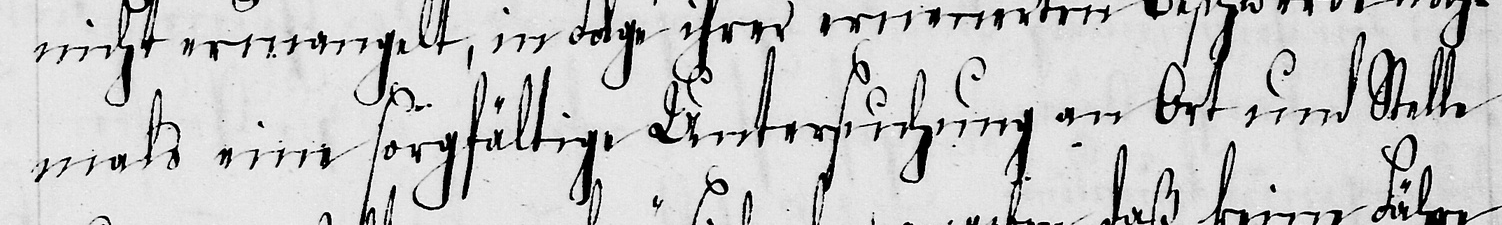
mals eine sorgfältige Untersuchung an Ort und Stelle
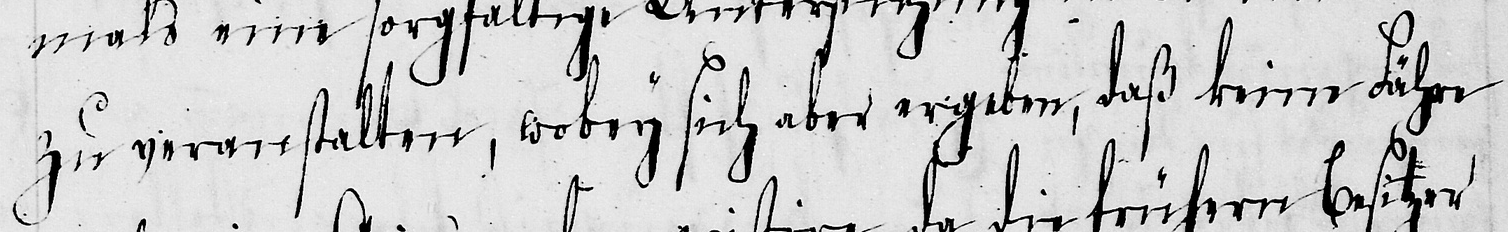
zu veranstalten, wobey sich aber ergeben, daß keine Fähre
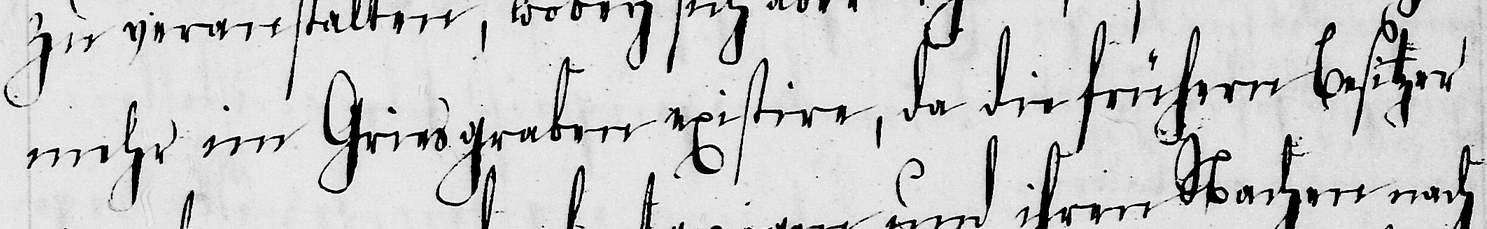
mehr im Griesgraben existire, da die frühern Besitzer
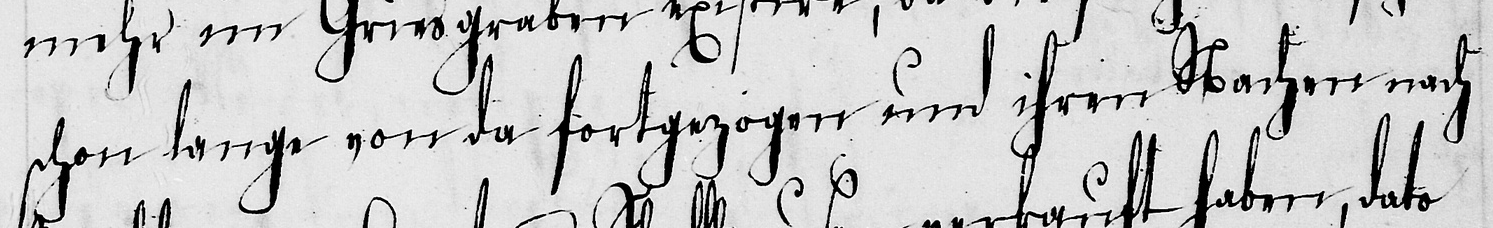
schon lange von da fortgezogen und ihren Nachen nach
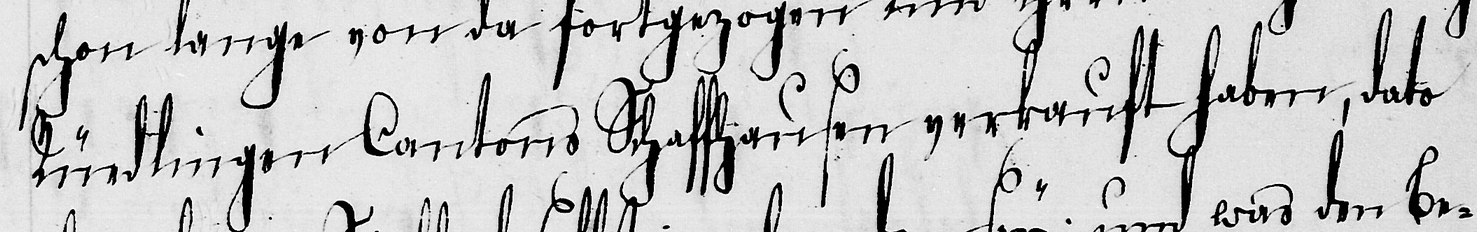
Rüedlingen Cantons Schaffhausen verkauft haben, dato
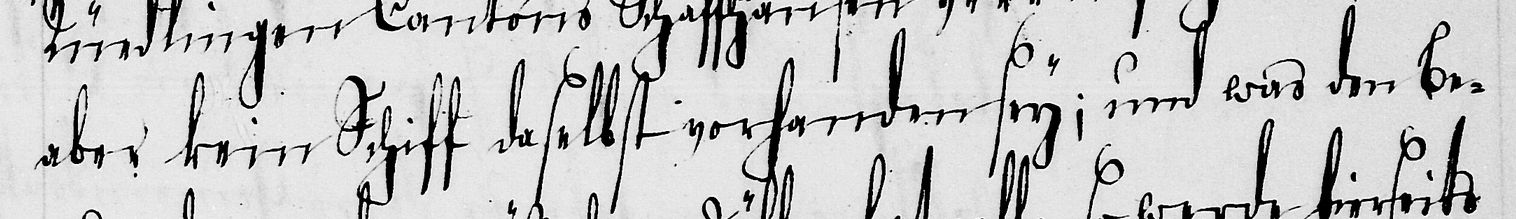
aber kein Schiff daselbst vorhanden sey; und was den Be¬
